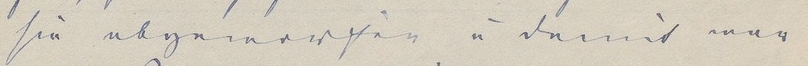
sie abgeworfen u damit war
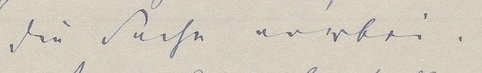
die Sache vorbei.
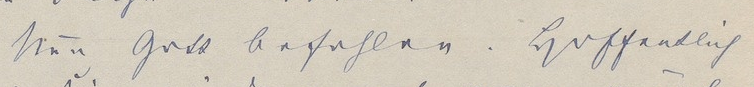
Nun Gott befohlen. Hoffentlich
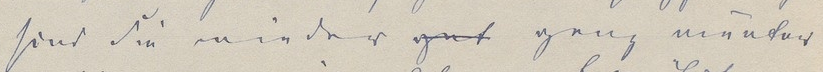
sind Sie wieder gut ganz munter
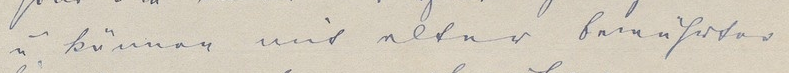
u können mit alter bewährter
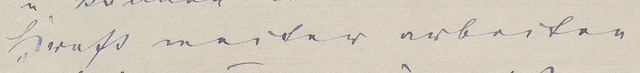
Kraft weiter arbeiten.
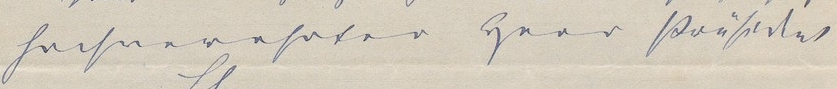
hochverehrter Herr Präsident
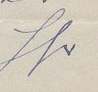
Ihr
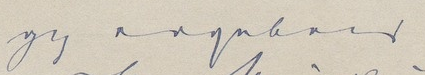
ganz ergebener
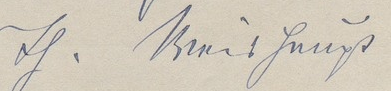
Th. Weishaupt
